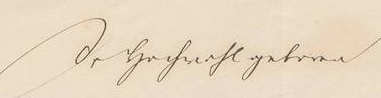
Sr Hochwohlgeboren
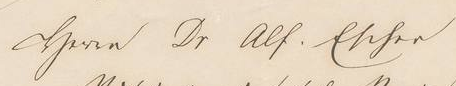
Herrn Dr Alf. Escher
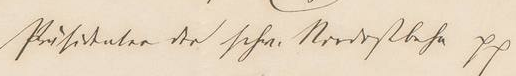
Präsidenten der schw. Nordostbahn pp
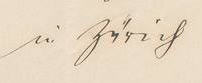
in Zürich
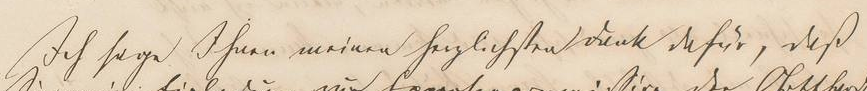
Ich sage Ihnen meinen herzlichsten Dank dafür, daß
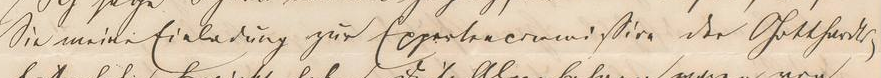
Sie meine Einladung zur Expertencomission der Gotthardts -
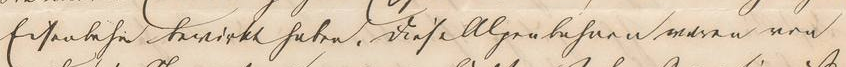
Eisenbahn bewirkt haben. Diese Alpenbahnen waren von
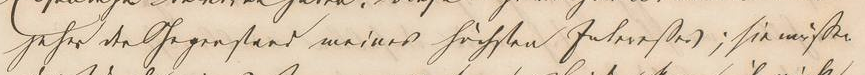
jeher der Gegenstand meines höchsten Interesses; sie müssen
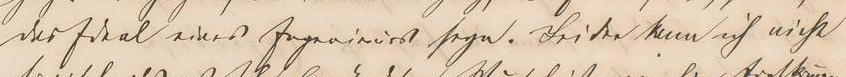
das Ideal eines Ingenieurs seyn. Leider kann ich nicht
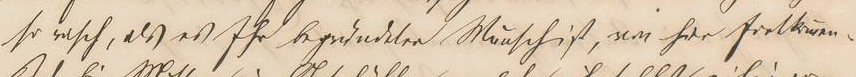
so rasch, als es Ihr begründeter Wunsch ist, von hier fortkommen.
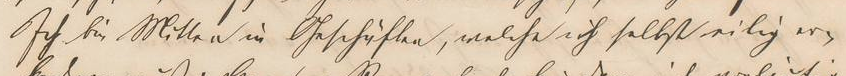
Ich bin Mitten in Geschäften, welche ich selbst eilig er-
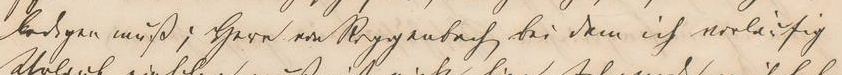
ledigen muß; Herr von Riggenbach bei dem ich vorläufig
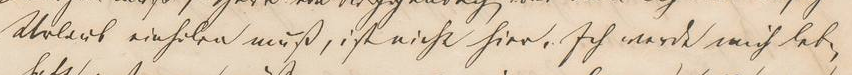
Urlaub einholen muß, ist nicht hier. Ich werde mich leb-
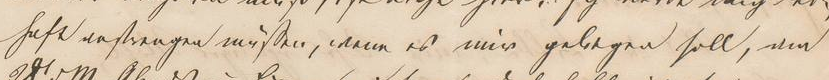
haft anstrengen müßen, wenn es mir gelingen soll, am
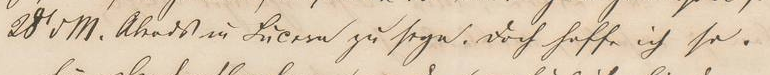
28t d. M. Abends in Lucern zu seyn. Doch hoffe ich so.
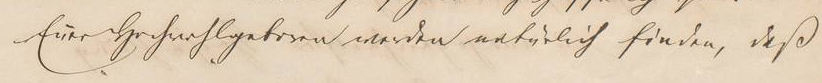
Euer Hochwohlgeboren werden natürlich finden, daß
